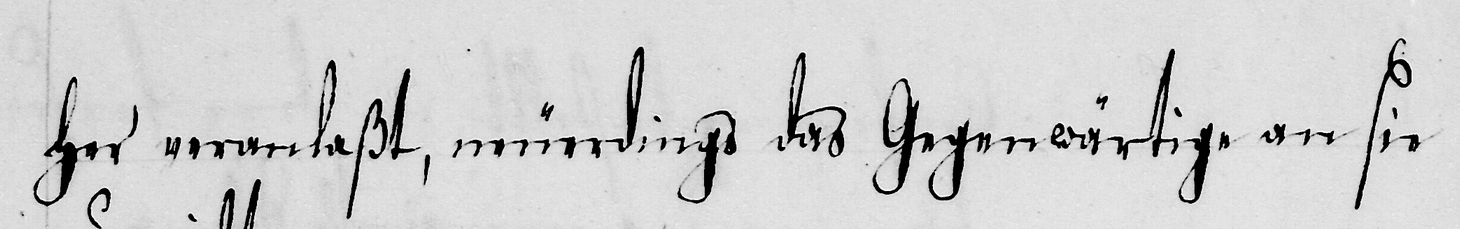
her veranlaßt, neuerdings das Gegenwärtige an sie
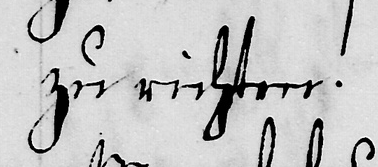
zu richten.
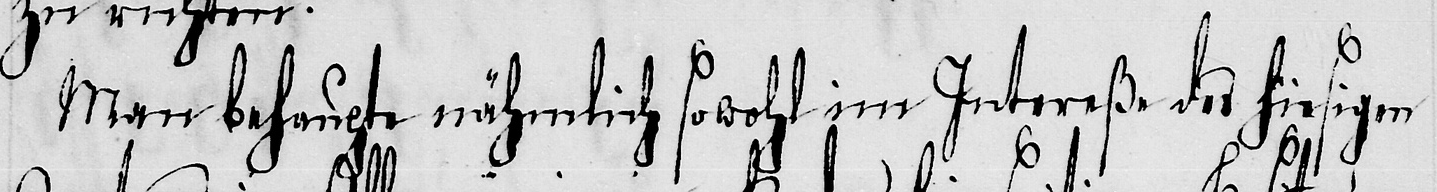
Man behaupte nämlich sowohl im Intereße des hiesigen
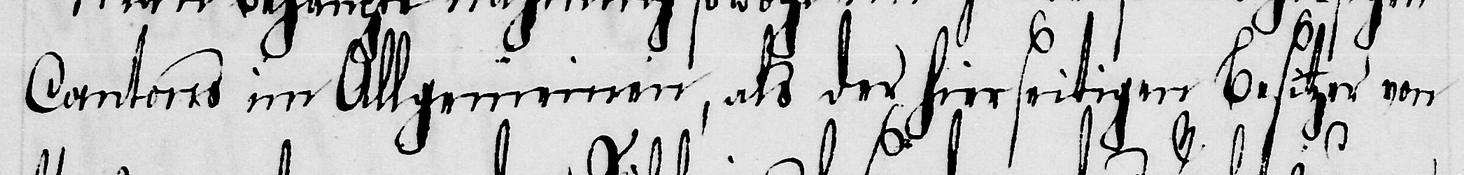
Cantons im Allgemeinen, als der hierseitigen Besitzer von
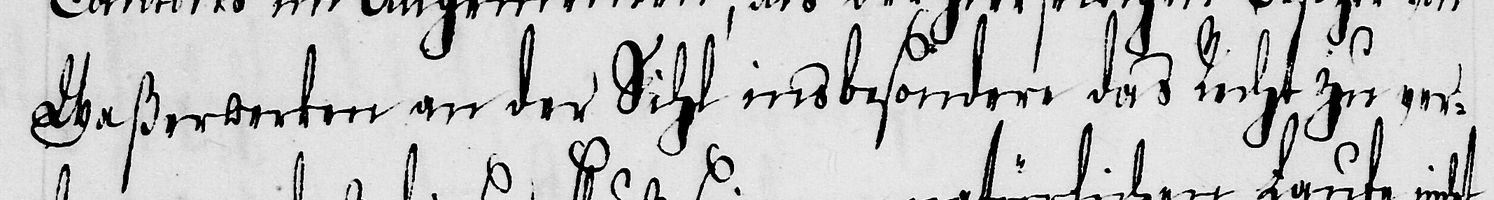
Waßerwerken an der Sihl insbesondere das Recht zu ver¬
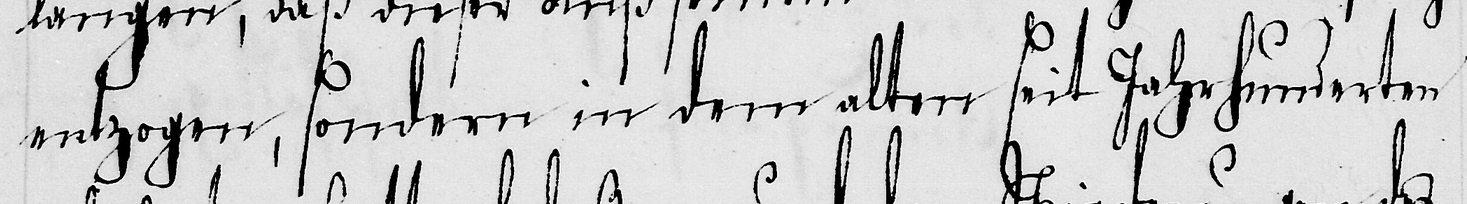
entzogen, sondern in dem alten seit Jahrhunderten
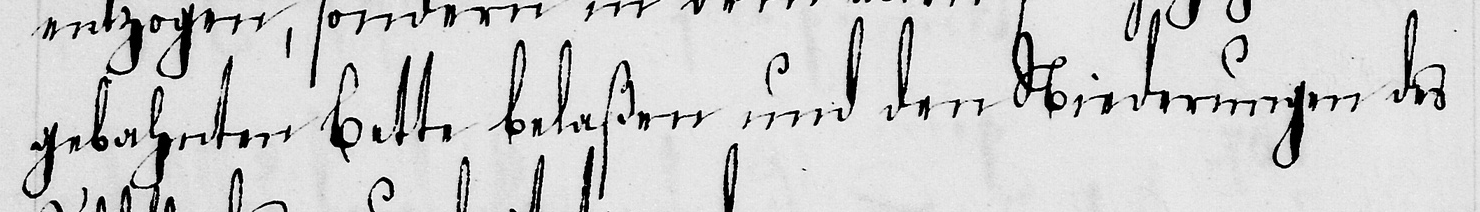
gebahnten Bette belaßen und den Niederungen des
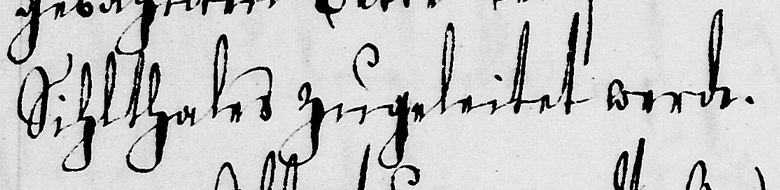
Sihlthales zugeleitet werde.
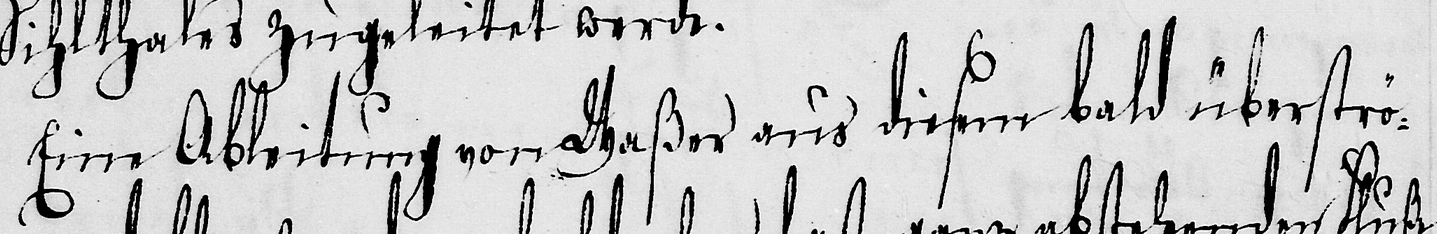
Eine Ableitung von Waßer aus diesem bald überströ¬
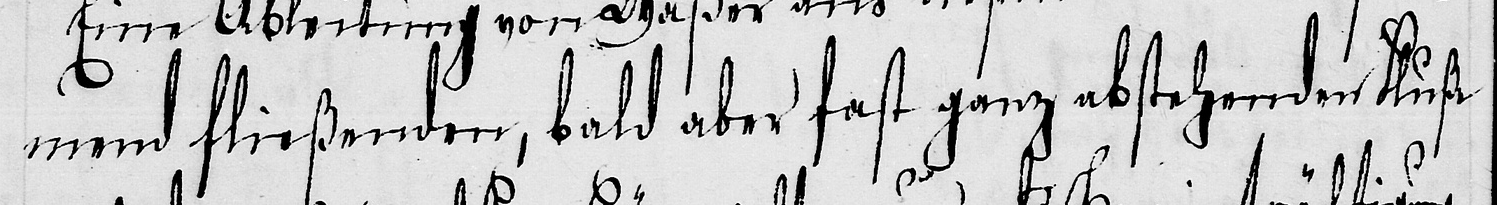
mend fließenden, bald aber fast ganz abstehenden Fluße
